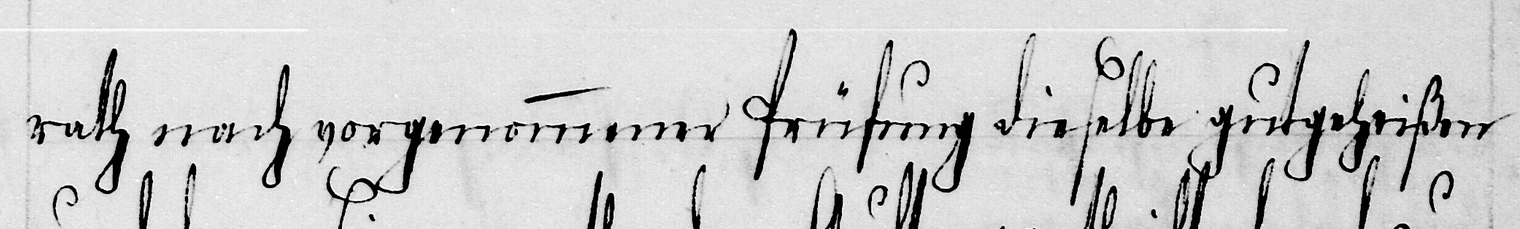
rath nach vorgenommener Prüfung dieselbe gutgeheißen
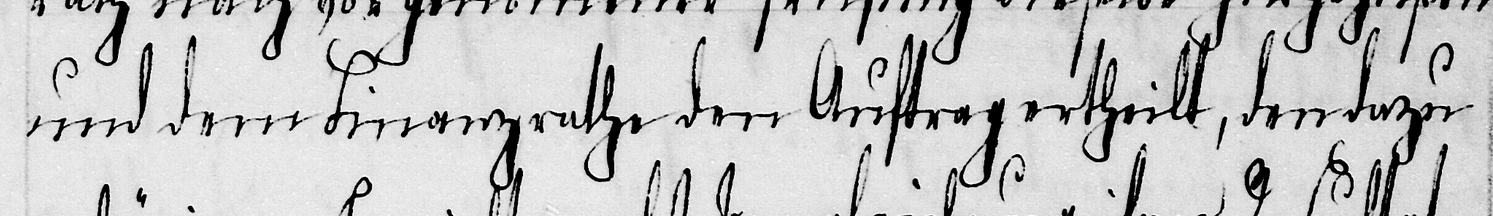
und dem Finanzrathe den Auftrag ertheilt, den dazu
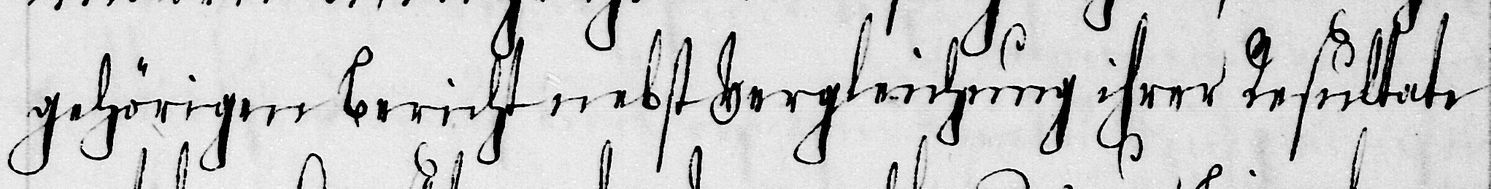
gehörigen Bericht nebst Vergleichung ihrer Resultate
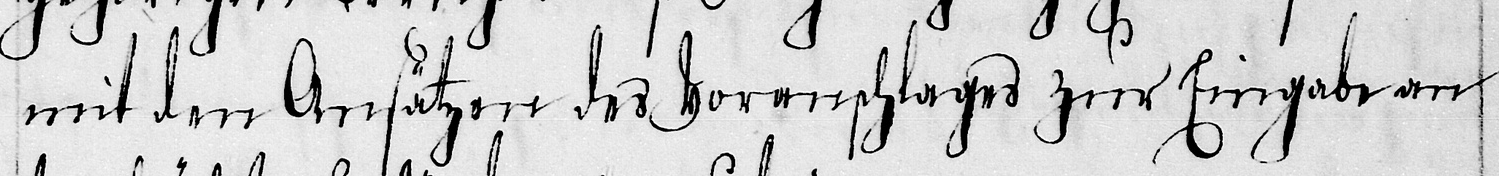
mit den Ansätzen des Voranschlages zur Eingabe an
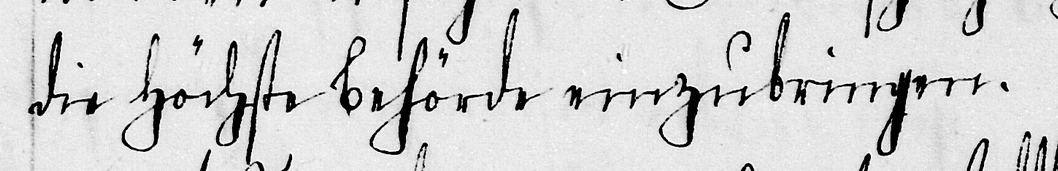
die Höchste Behörde einzubringen.
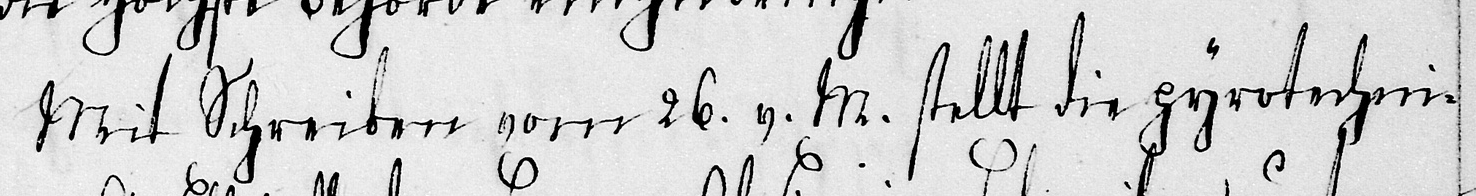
Mit Schreiben vom 26. v. M. stellt die pyrotechnis¬
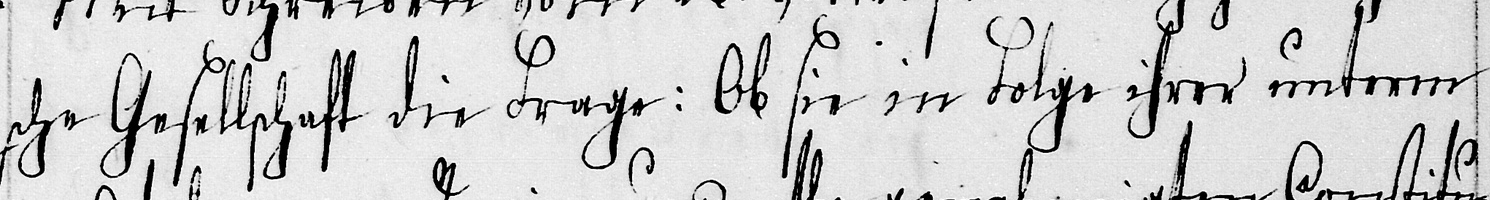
che Gesellschaft die Frage: Ob sie in Folge ihrer unterm
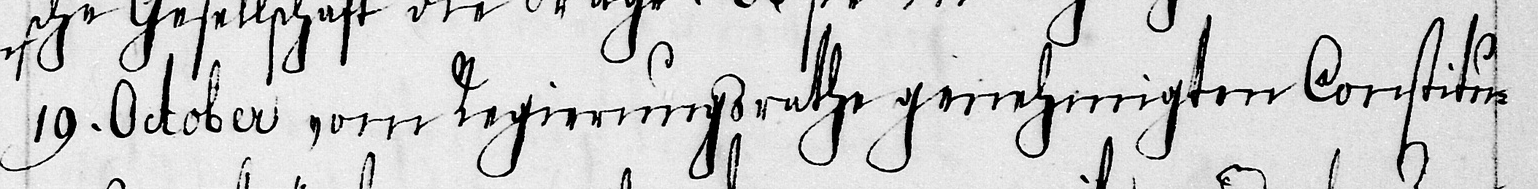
19. October vom Regierungsrathe genehmigten Constitui¬
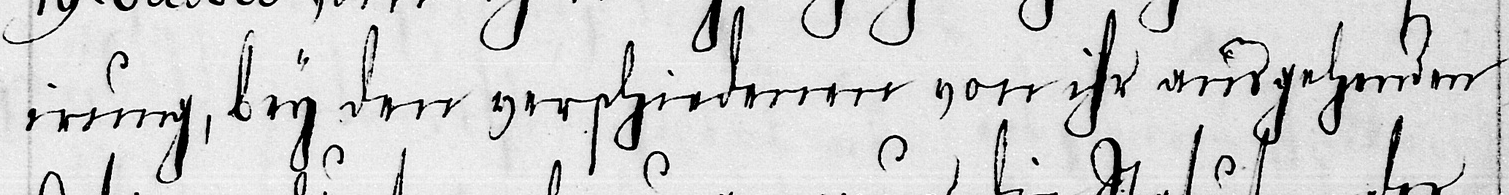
rung, bey den verschiedenen von ihr ausgehenden
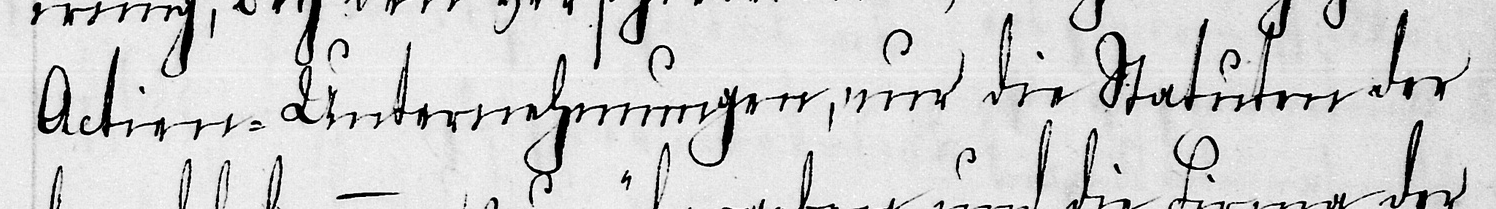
Actien-Unternehmungen, nur die Statuten der
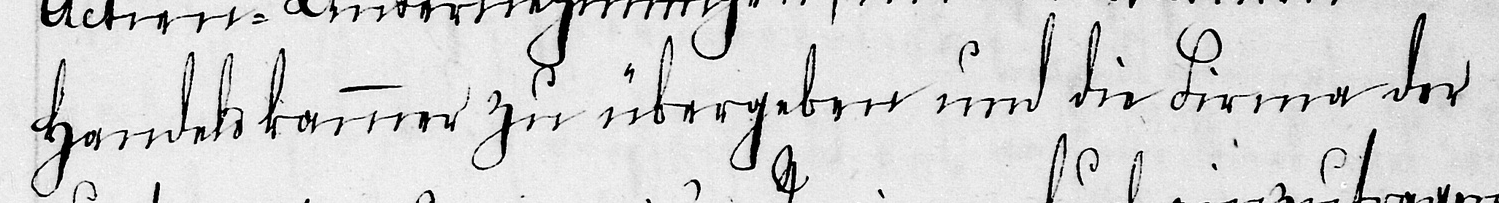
Handelskammer zu übergeben und die Firma der
